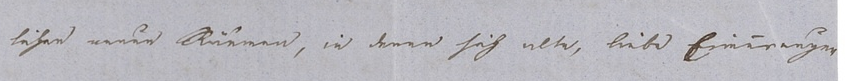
lichen neuen Räumen, in denen sich alte, liebe Erinnerungen
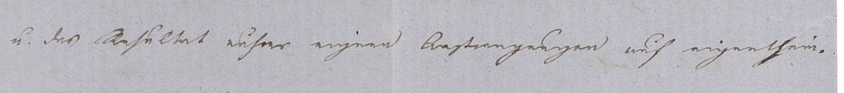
u. das Resultat unsrer eignen Anstrengungen auf eigenthüm-
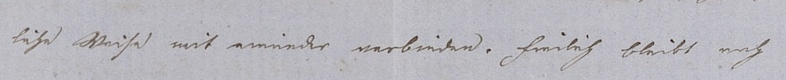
liche Weise mit einander verbinden. Freilich bleibt noch
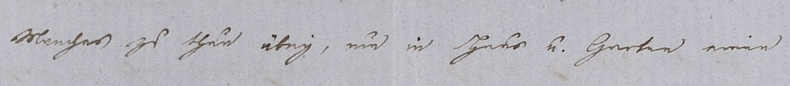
Manches zu thun übrig, um in Haus u. Garten einen
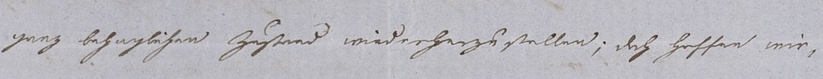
ganz behaglichen Zustand wiederherzustellen; doch hoffen wir,
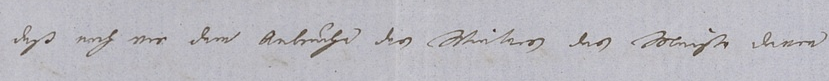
daß noch vor dem Ausbruche des Winters das Meiste davon
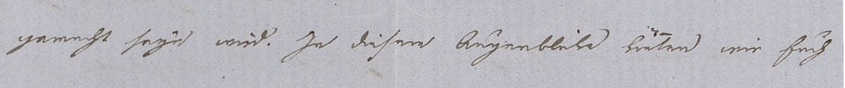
gemacht seyn wird. In diesem Augenblicke könnten wir Euch
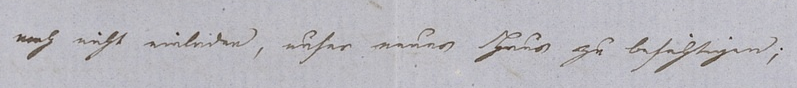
noch nicht einladen, unser neues Haus zu besichtigen,
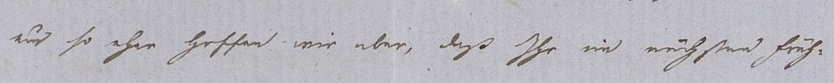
um so eher hoffen wir aber, daß Ihr im nächsten Früh-
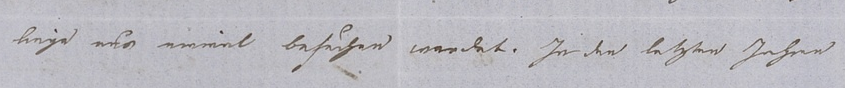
linge uns einmal besuchen werdet. In den letzten Jahren
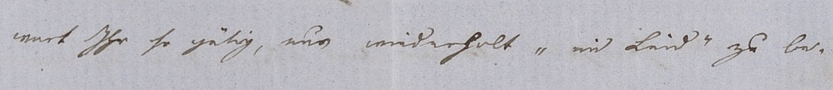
wart Ihr so gütig, uns wiederholt «im Leid» zu be-
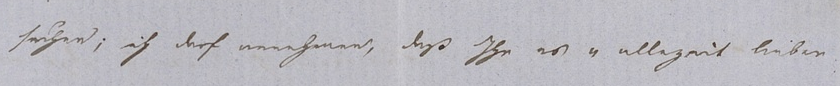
suchen; ich darf annehmen, daß Ihr es «allzeit lieber
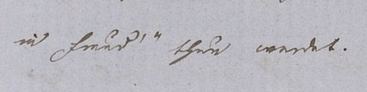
in Freud'» thun werdet.
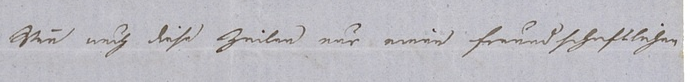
Wenn auch diese Zeilen nur einen freundschaftlichen
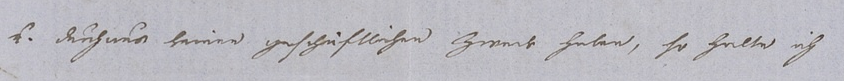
u. durchaus keinen geschäftlichen Zweck haben, so halte ich
